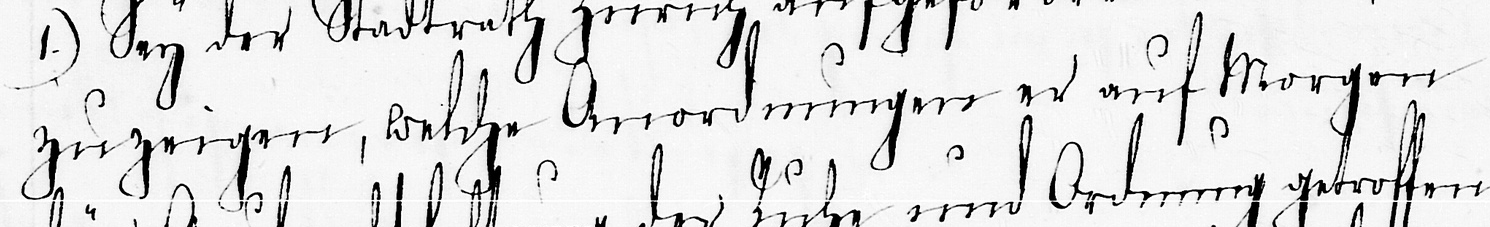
zuzeigen, welche Anordnungen er auf Morgen
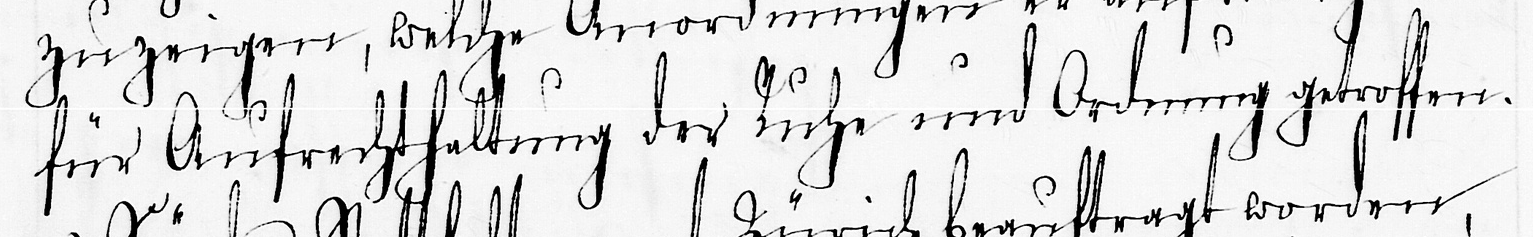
für Aufrechthaltung der Ruhe und Ordnung getroffe¬
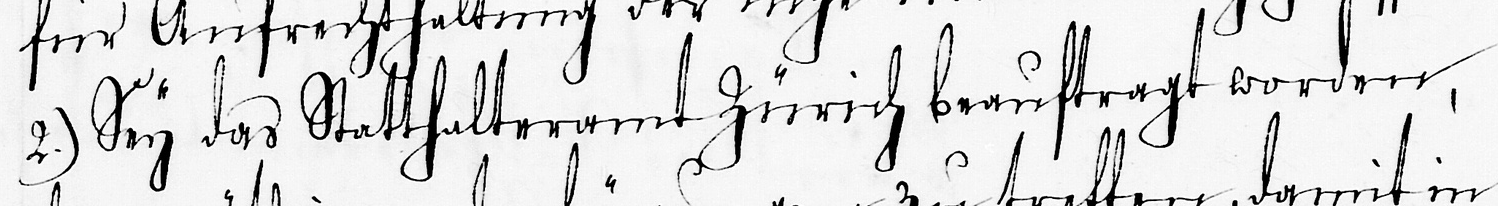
2.) Sey das Statthalteramt Zürich beauftragt worden,
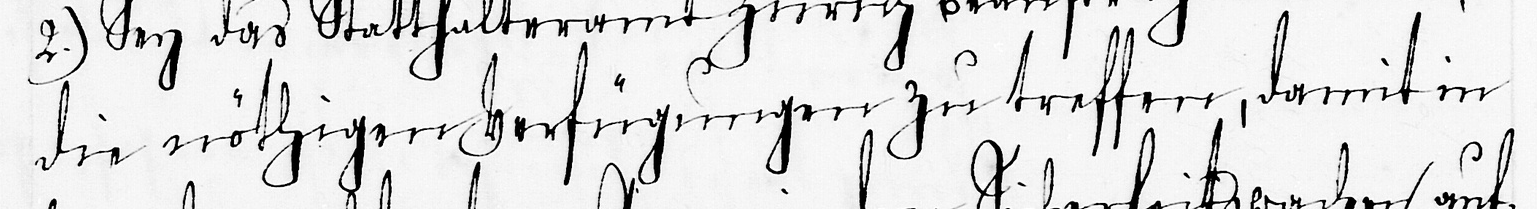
die nöthigen Verfügungen zu treffen, damit in
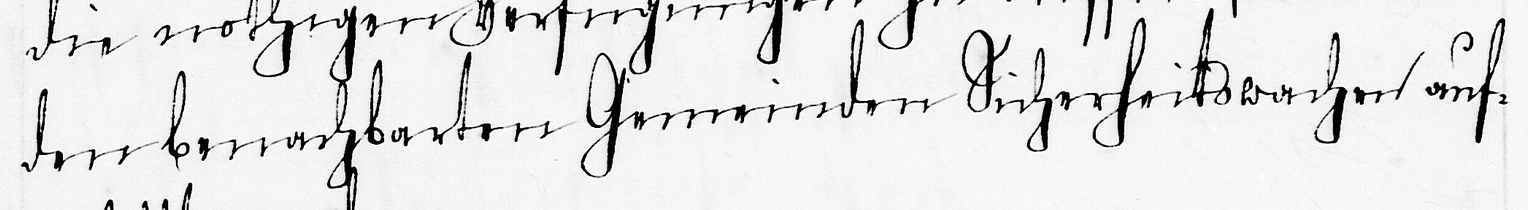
den benachbarten Gemeinden Sicherheitswachen auf¬
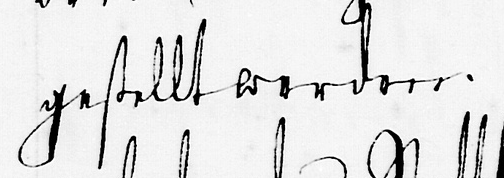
gestellt werden.
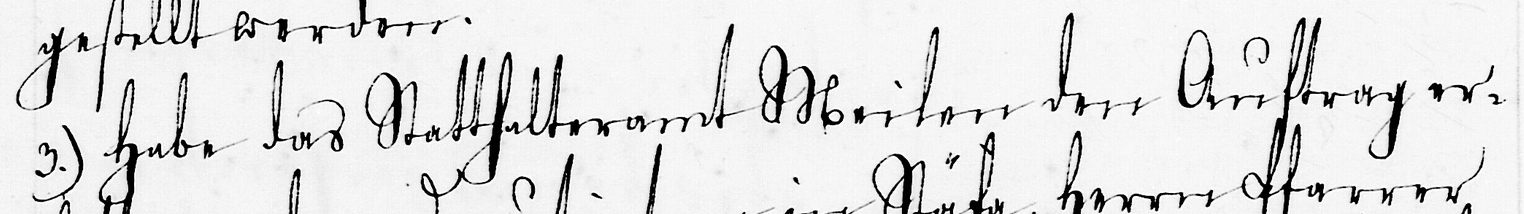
3.) Habe das Statthalteramt Meilen den Auftrag er¬
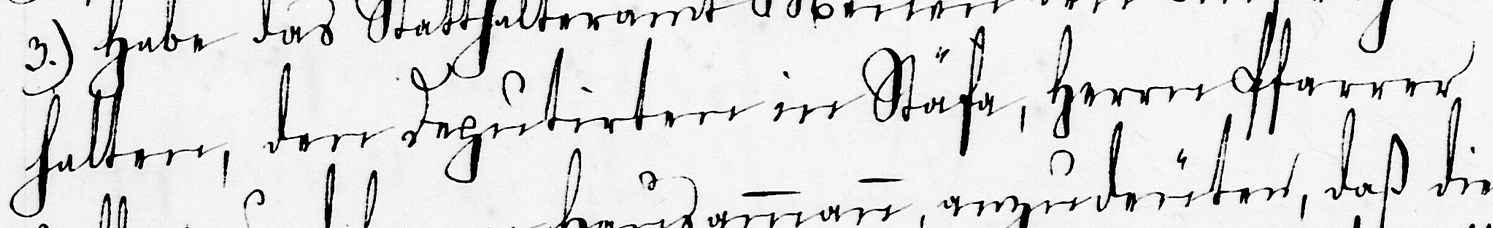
halten, den Deputirten in Stäfa, Herrn Pfarrer
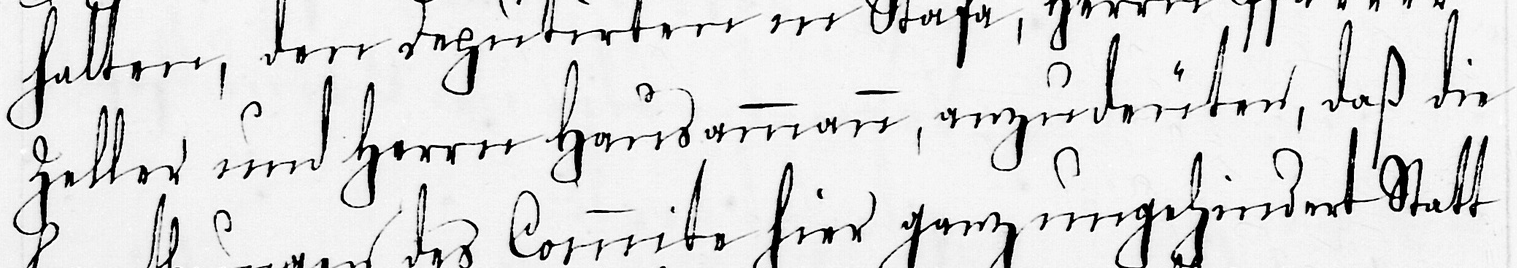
Zeller und Herrn Hausammann, anzudeuten, daß die
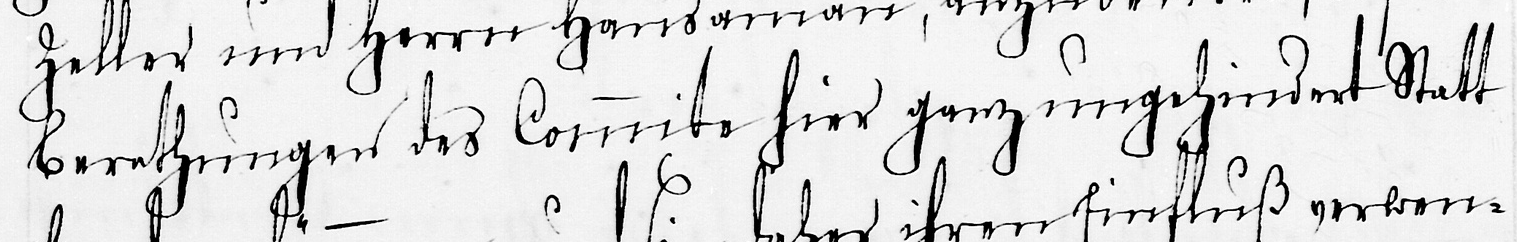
Berathungen des Commite hier ganz ungehindert Statt
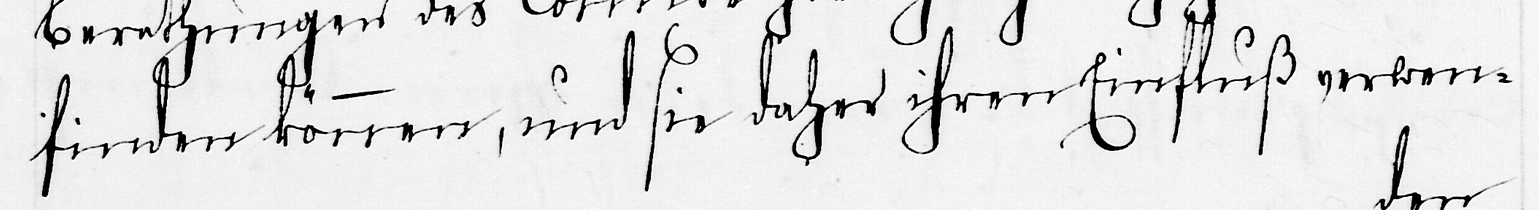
finden können, und sie daher ihren Einfluß verwen-
